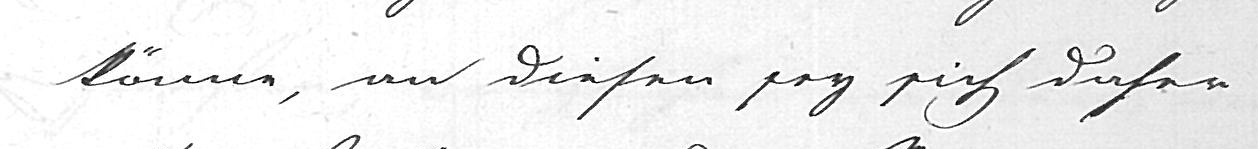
könne, an diesen sey sich daher
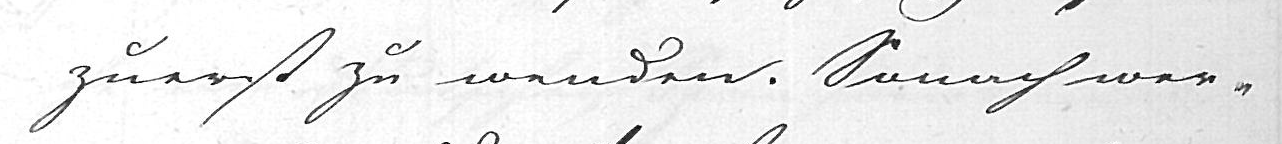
zuerst zu wenden. Sonach wer-
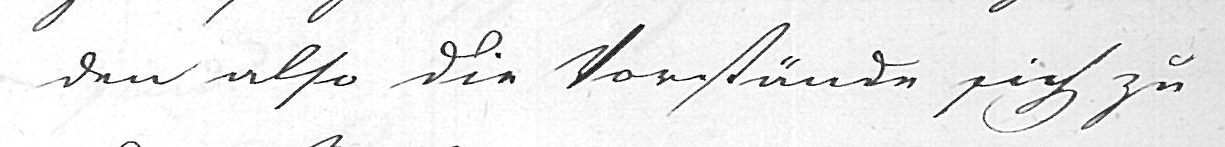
den also die Vorstände sich zu
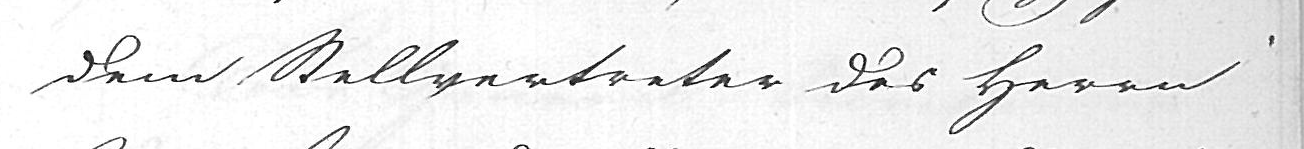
dem Stellvertreter des Herrn
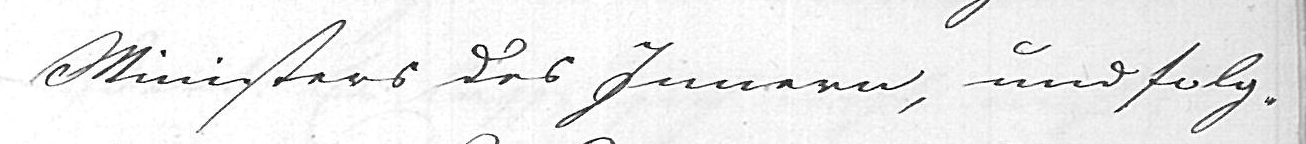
Ministers des Innern, und folg-
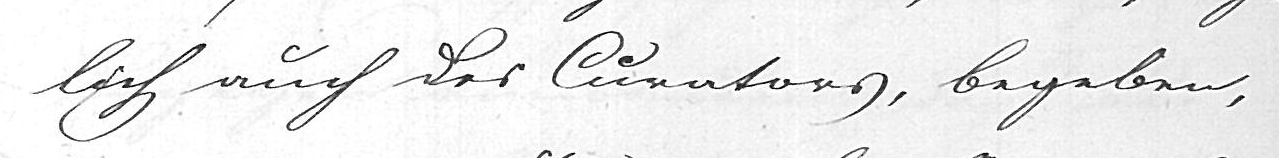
lich auch der Curators, begeben,
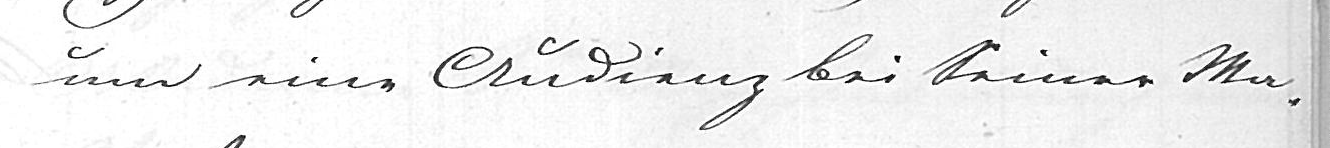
um eine Audienz bei Seiner Ma-
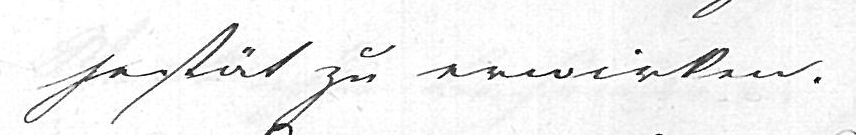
jestät zu erwirken.
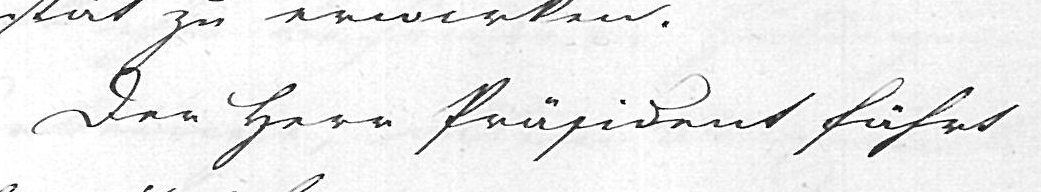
Der Herr Präsident fährt
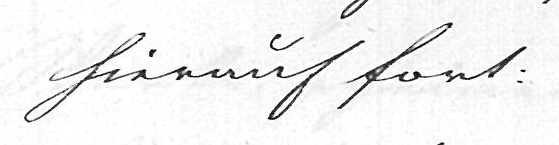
hierauf fort:
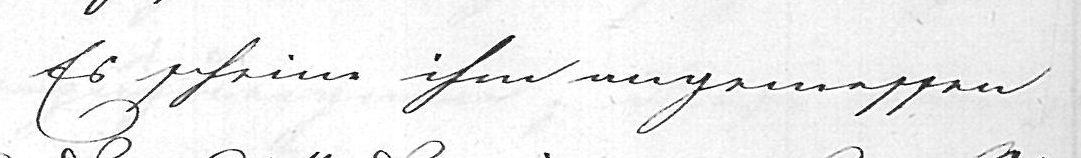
Es scheine ihm angemessen
